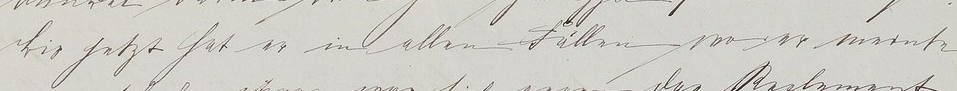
Bis jetzt hat er in allen Fällen wo er meinte
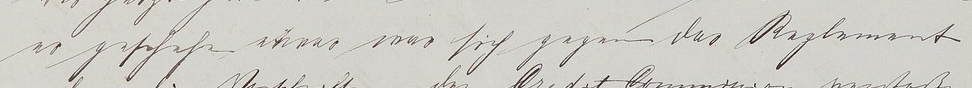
es geschehe etwas was sich gegen das Reglement
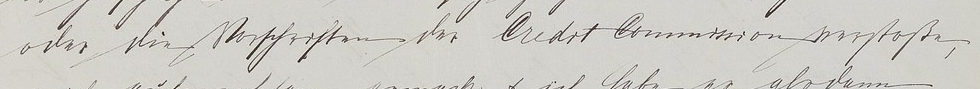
oder die Vorschriften der Credit Commission verstoße,
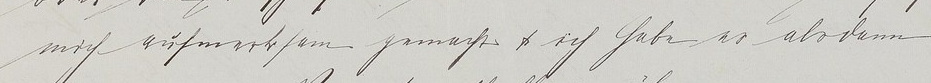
mich aufmerksam gemacht & ich habe es alsdann
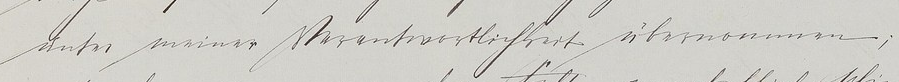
unter meiner Verantwortlichkeit übernommen;
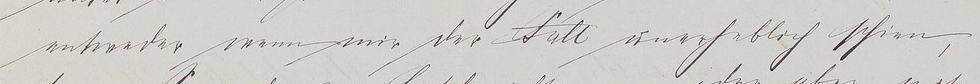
entweder wenn mir der Fall unerheblich schien,
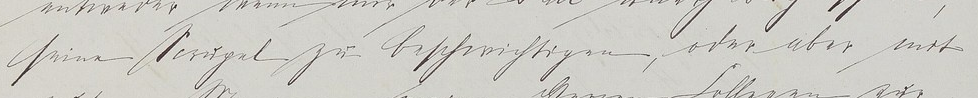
seine Scrupel zu beschwichtigen, oder aber mit
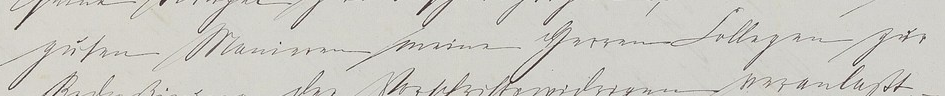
guten Manieren meine Herren Collegen zur
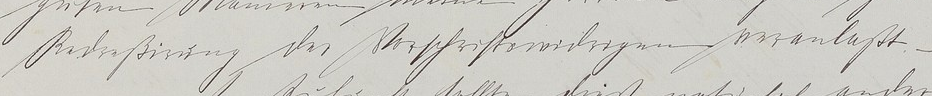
Redreßirung des Vorschriftswidrigen veranlaßt. –
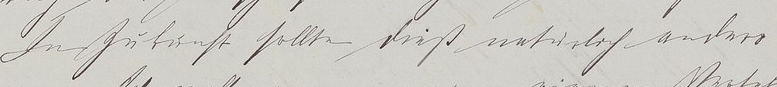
In Zukunft sollte dieß natürlich anders
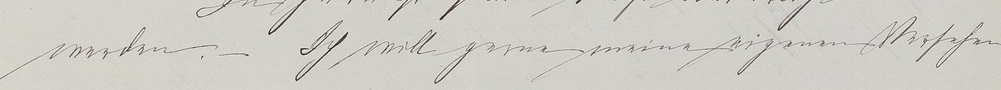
werden. Ich will gerne meine eigenen Versehen
